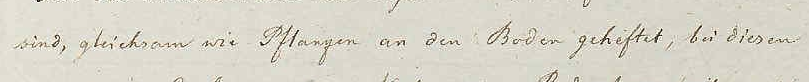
sind, gleichsam wie Pflanzen an den Boden geheftet, bei diesen
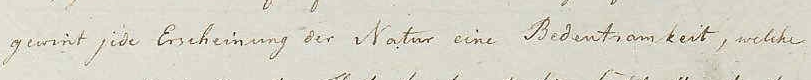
gewint jede Erscheinung der Natur eine Bedeutsamkeit, welche
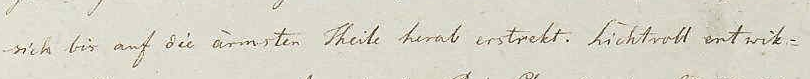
sich bis auf die ärmsten Theile herab erstrekt. Lichtvoll entwik-
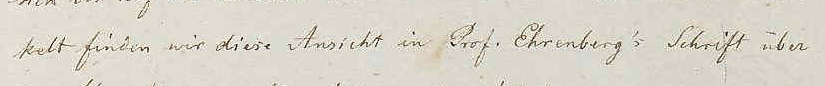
kelt finden wir diese Ansicht in Prof. Ehrenberg's Schrift über
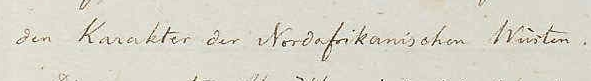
den Karakter der Nordafrikanischen Wüsten.
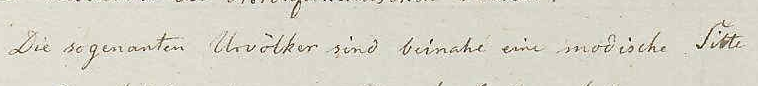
Die sogenanten Urvölker sind beinahe eine modische Sitte
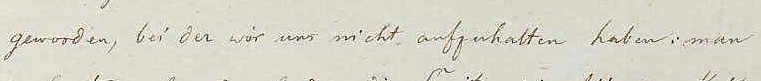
geworden, bei der wir uns nicht aufzuhalten haben: man
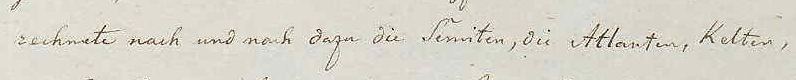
rechnete nach und nach dazu die Semiten, die Atlanten, Kelten,
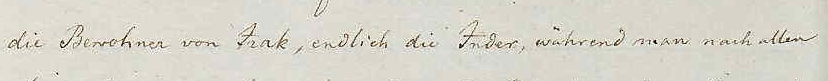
die Bewohner von Irak, endlich die Inder, während man nach allen
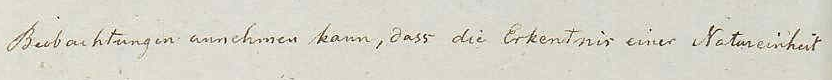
Beobachtungen annehmen kann, dass die Erkentnis einer Natureinheit
